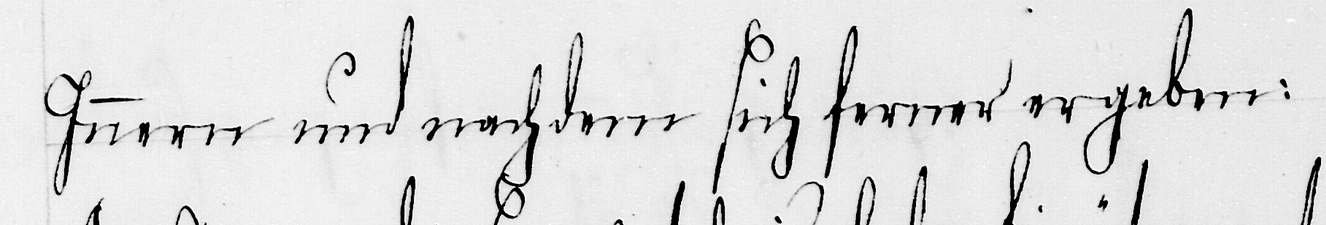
Innern und nachdem sich ferner ergeben:
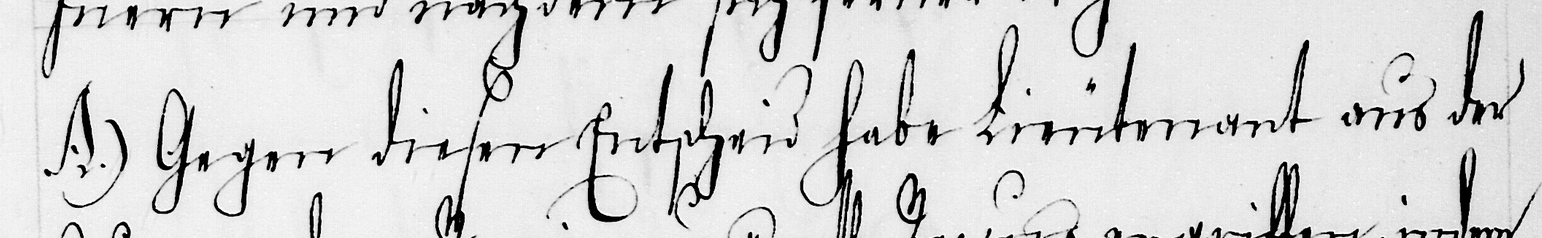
A.) Gegen diesen Entscheid habe Lieutenant aus der
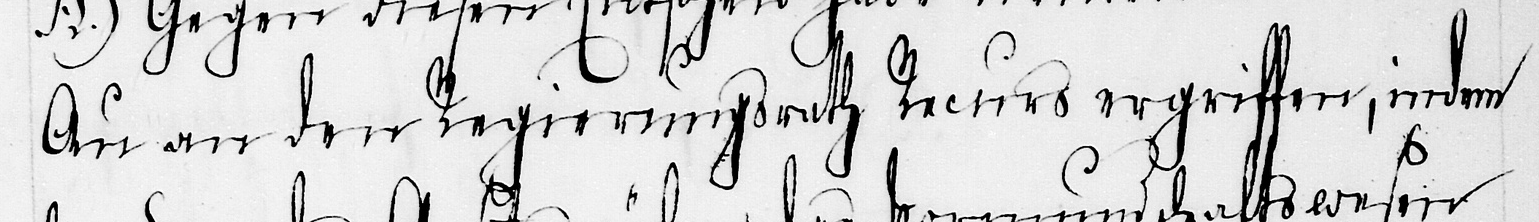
Au an den Regierungsrath Recurs ergriffen, indem
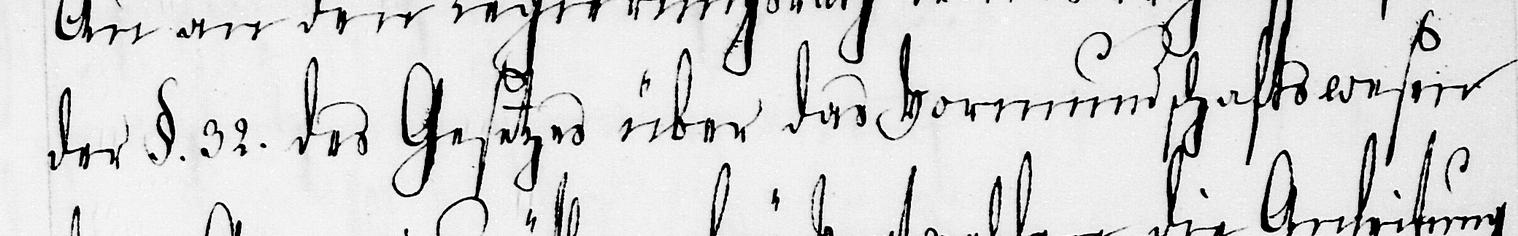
der §. 32. des Gesetzes über das Vormundschaftswesen
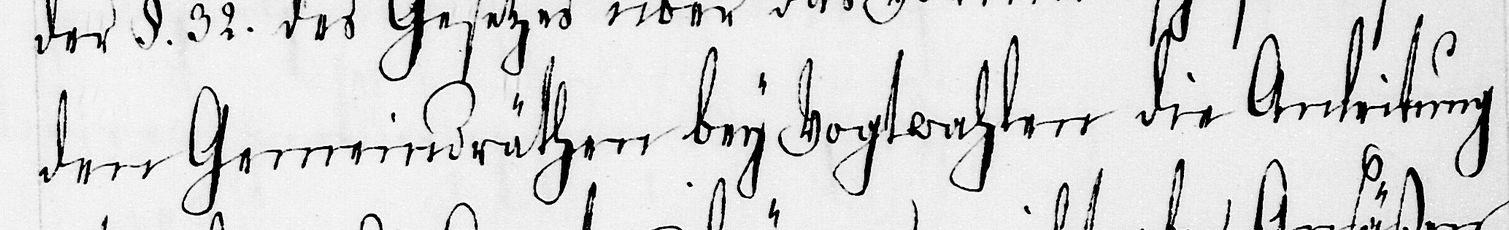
den Gemeindräthen bey Vogtwahlen die Anleitung
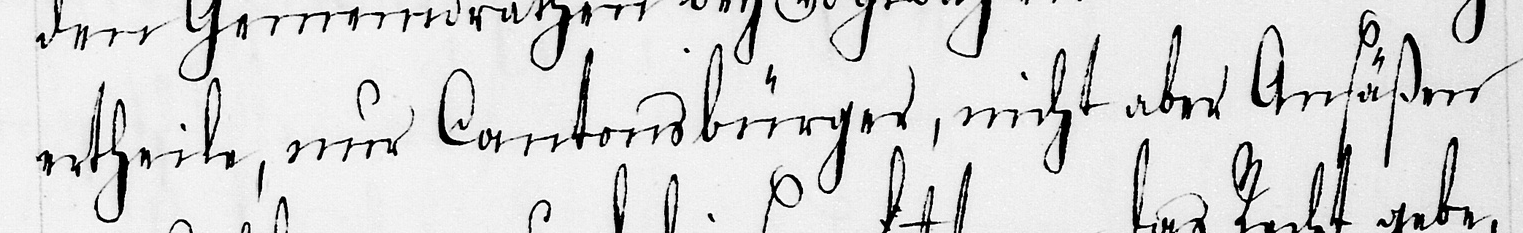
ertheile, nur Cantonsbürger, nicht aber Ansäßen
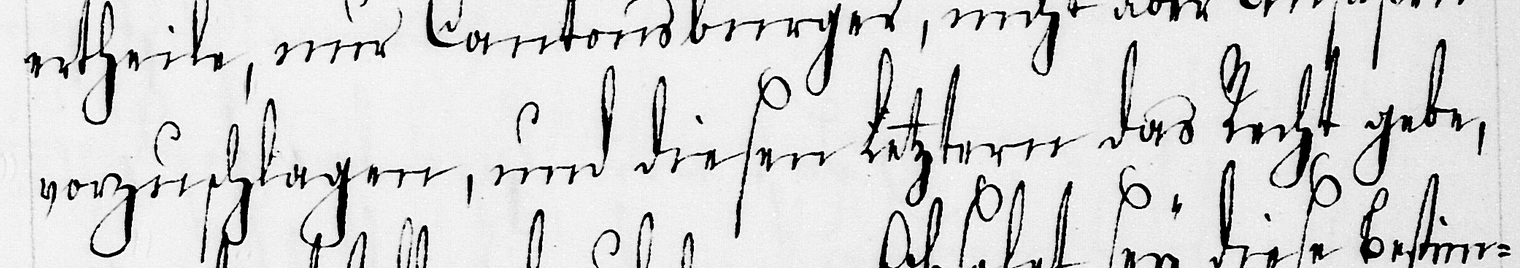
vorzuschlagen, und diesen Letztern das Recht gebe,
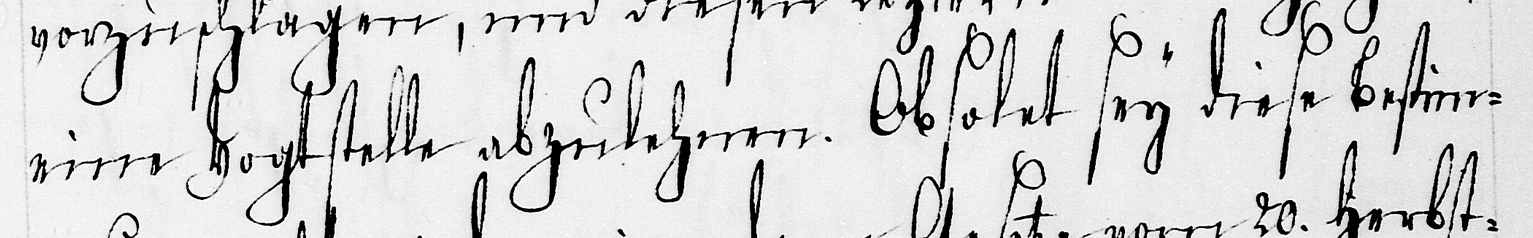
eine Vogtstelle abzulehnen. Obsolet sey diese Bestim¬
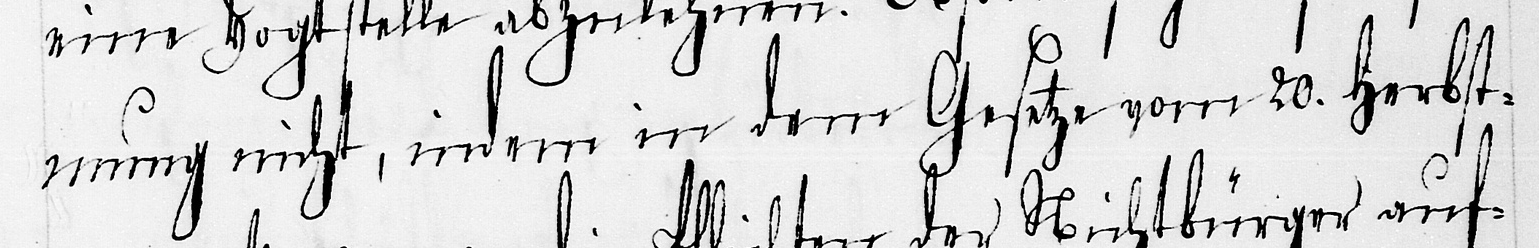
mung nicht, indem in dem Gesetze vom 20. Herbst¬
